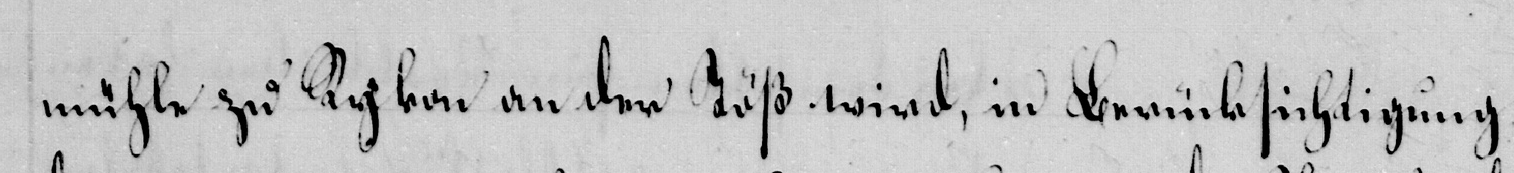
mühle zu Rykon an der Töß wird, in Berücksichtigung
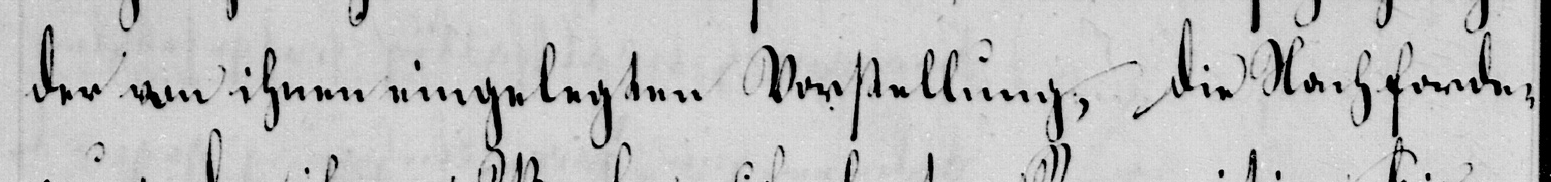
der von ihren eingelegten Vorstellung, die Nachforde¬
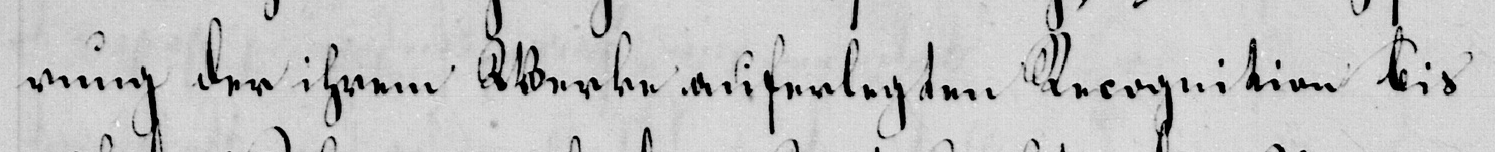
rung der ihrem Werke auferlegten Recognition bis
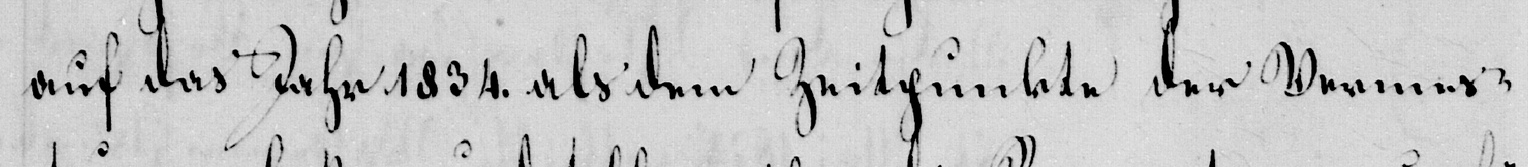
auf das Jahr 1834. als dem Zeitpunkte der Verme¬
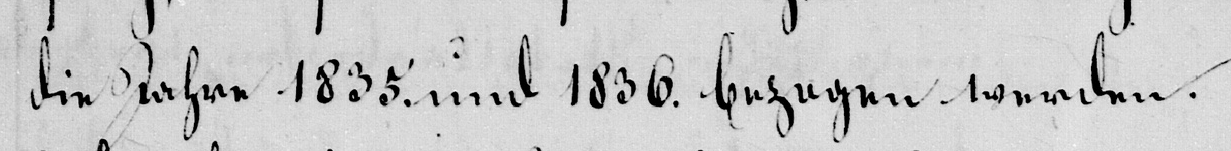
die Jahre 1835. und 1836. bezogen werden.
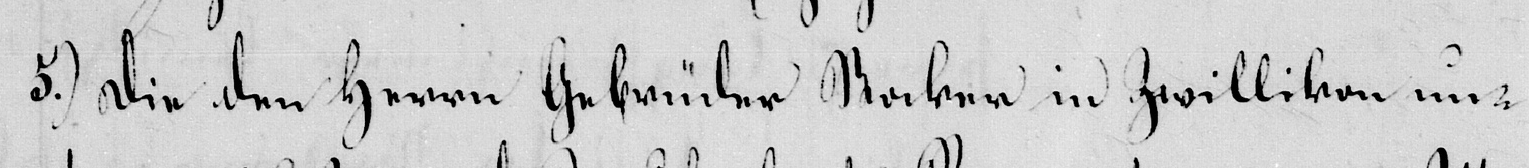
5.) Die den Herren Gebrüder Stocker in Zwillikon un¬
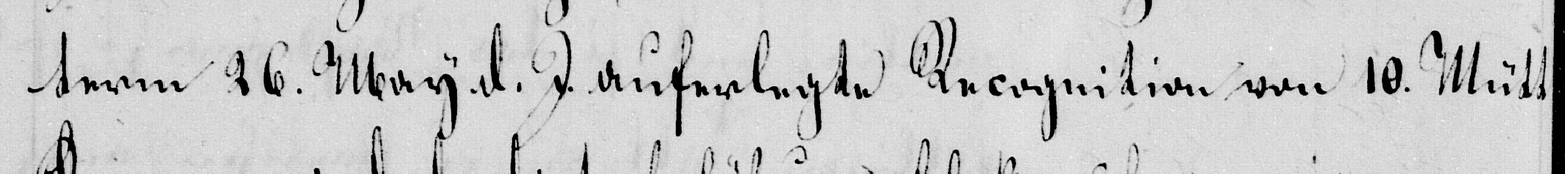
term 26. May d. J. auferlegte Recognition von 10. Mütt
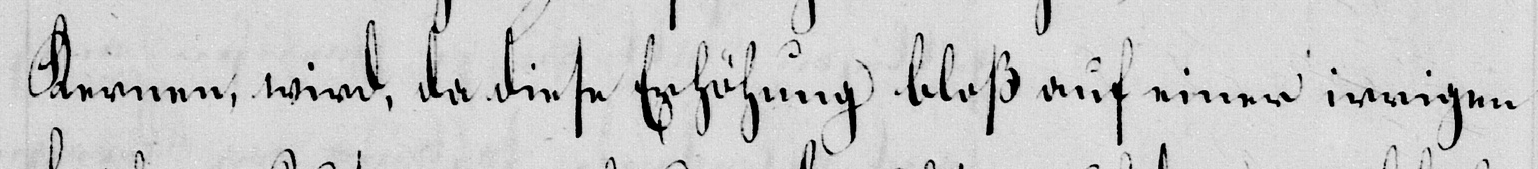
Kernen, wird, da diese Erhöhung bloß auf einer irrigen
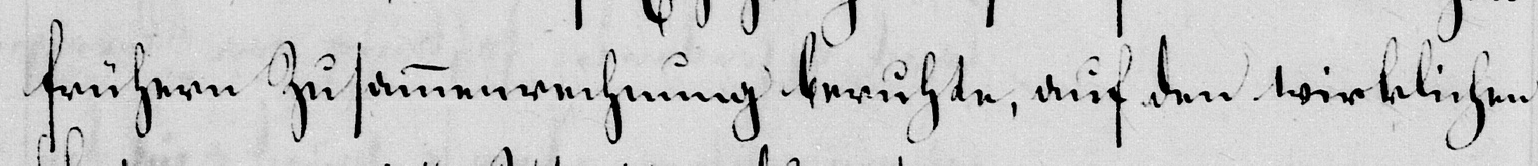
frühern Zusammenrechnung beruhte, auf den wirklichen
